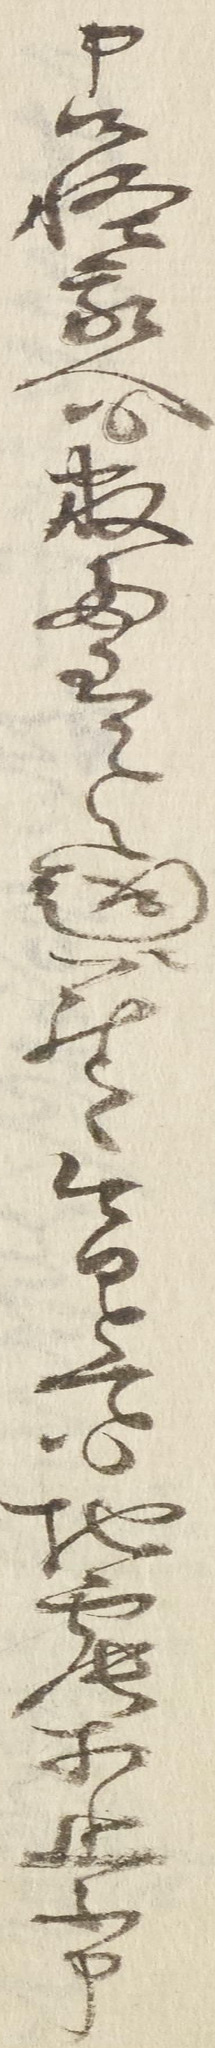申候怪我人も数多有之候趣二御座候今日とても地震相止不申
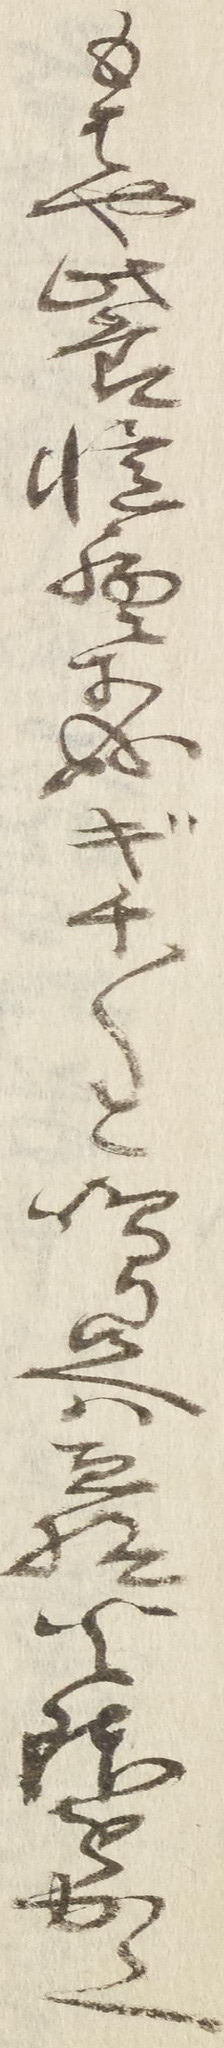もはや此節臆病に相成ギチ〳〵と鳴り候へは直様火鉢をかゝへ
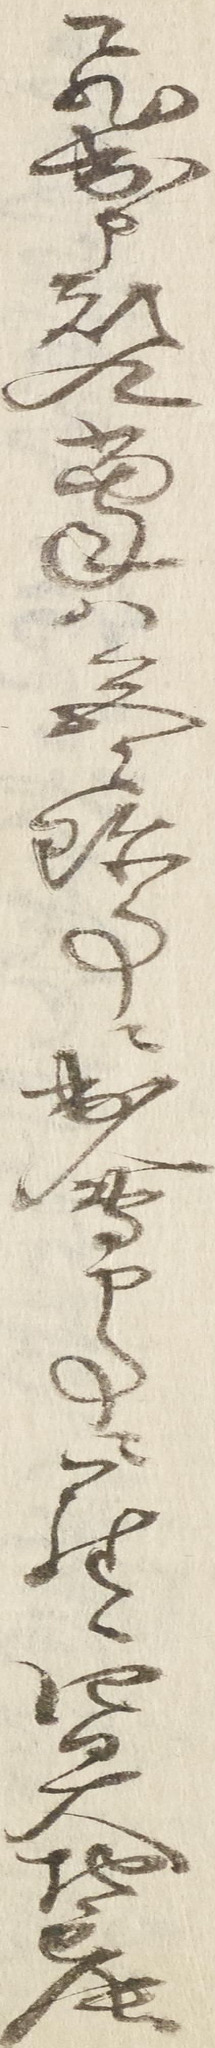飛出申都合当年は色々珍事に出会申事に御座候四日大地震
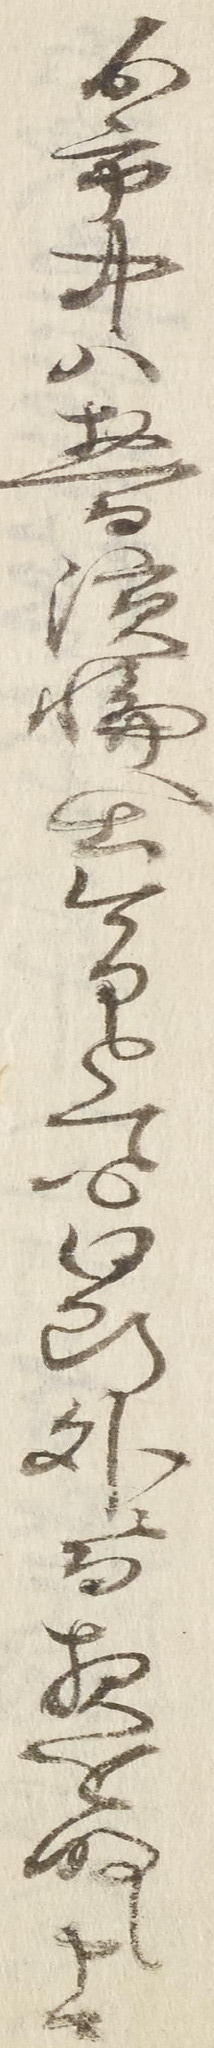ゟ市中は惣而浜輪へ出今日とても同断外二而夜を明し申候
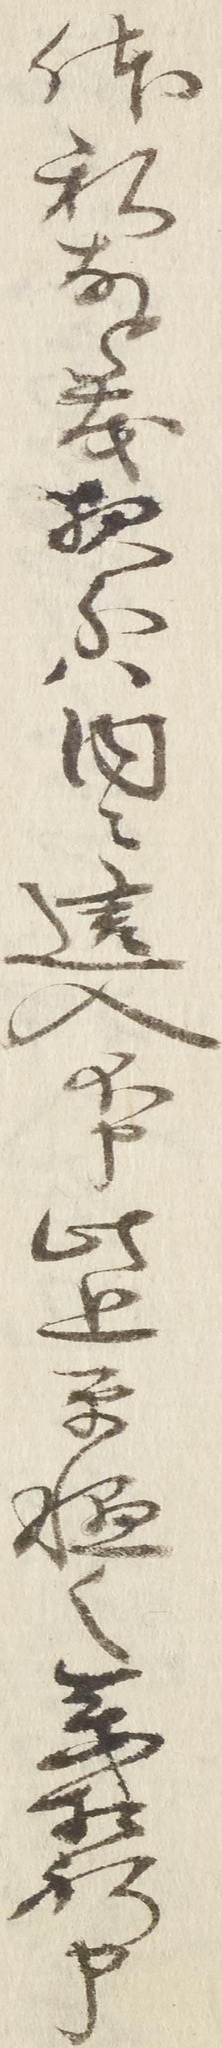体私なとも夜分は内に這入不申此上平穏之義相祈申
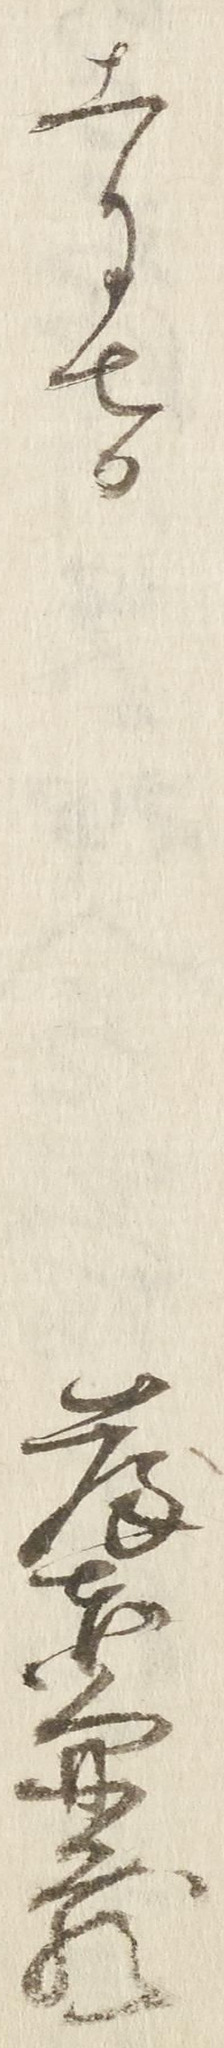十一月七日岸本兼蔵
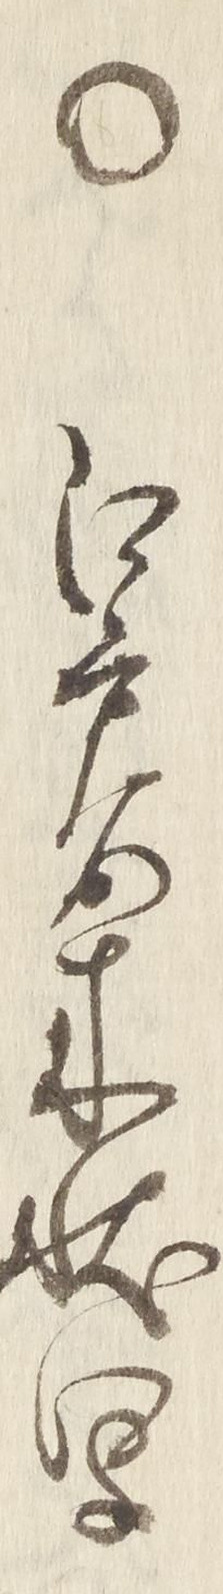◯江戸ゟ来状写
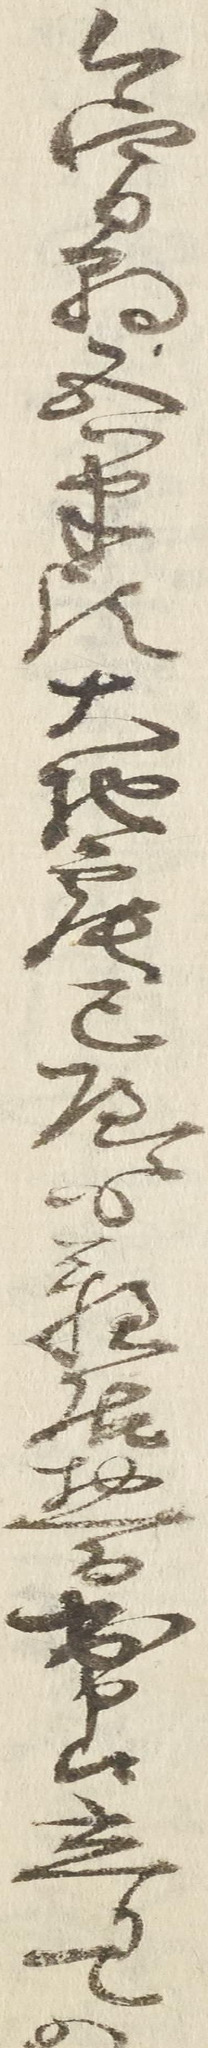今四日朝五ッ半頃大地震已屋にも難居惣而出申候立りての
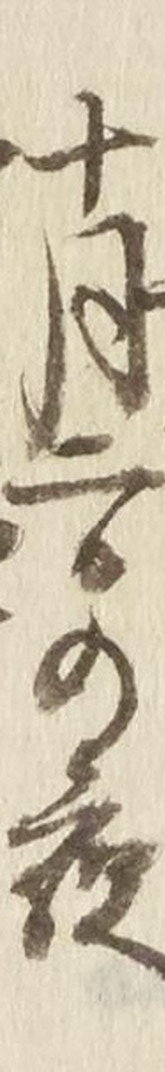十月二日の夜
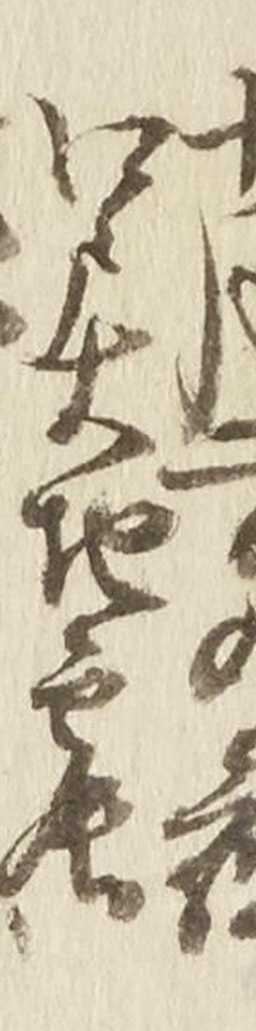江戸大地震
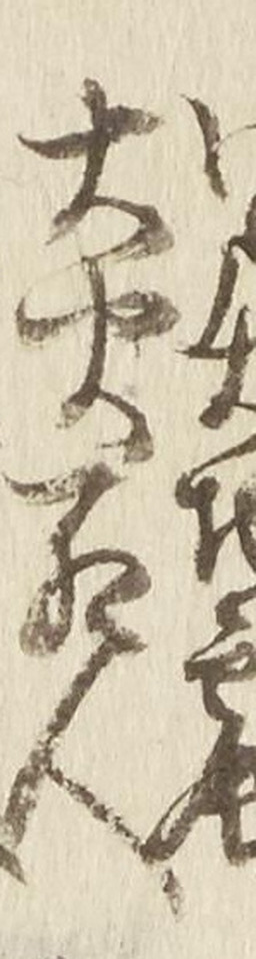大火死人
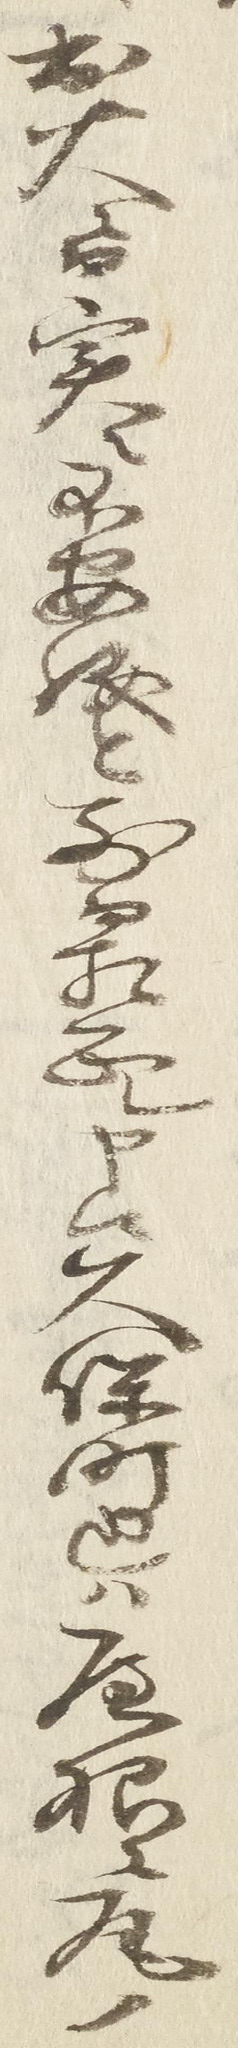出火二而実に不安儀と別而相恐ㇾ申候久保町辺は屋根二瓦ノ
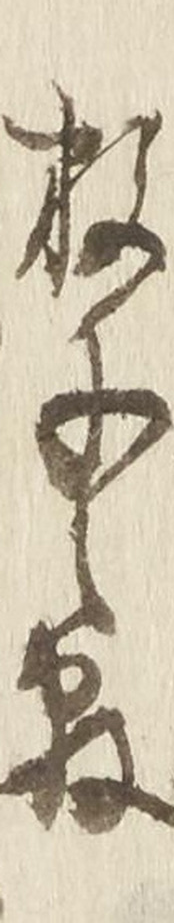数千之数
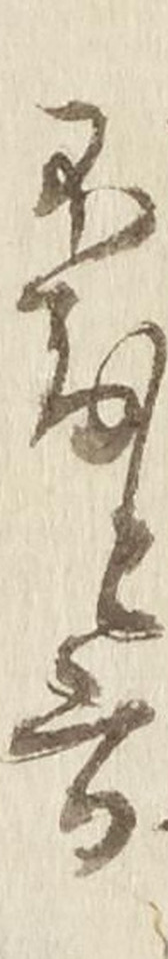不知と言
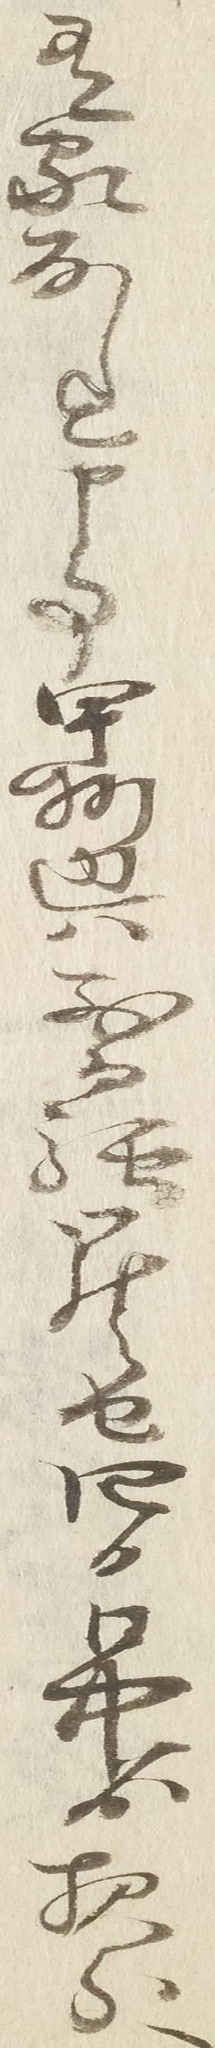有家なしと申事甲州辺は別而強御座候由四日日中ゟ夜分へ
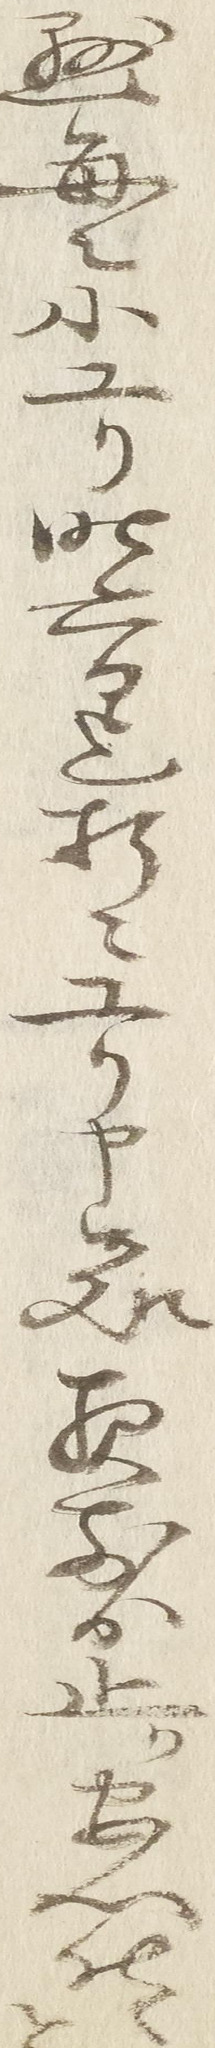懸毎々小ユリ昨六日迄折々ユリ申候処夜前ゟ止り安心仕侯と
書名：地震記　下
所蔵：東京大学地震研究所図書室 Earthquake Research Institute Library, The University of Tokyo, JAPAN
